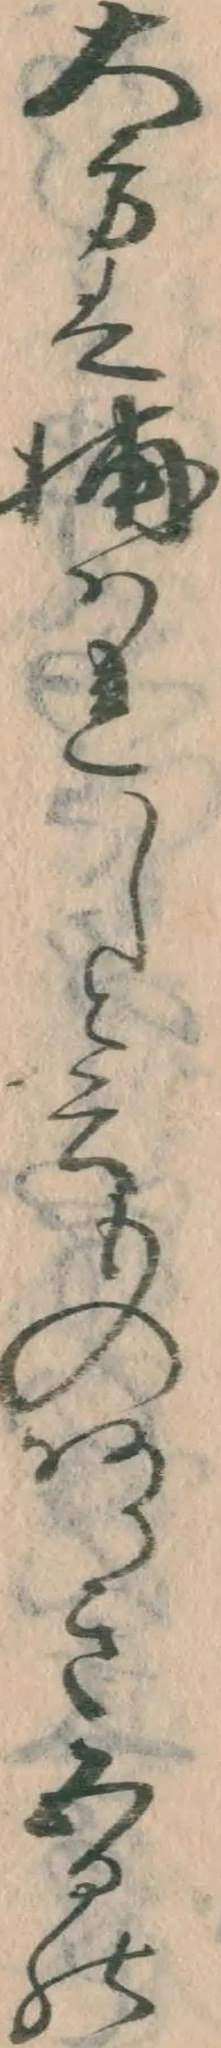大方は捕ハれしと云ものありき五日の
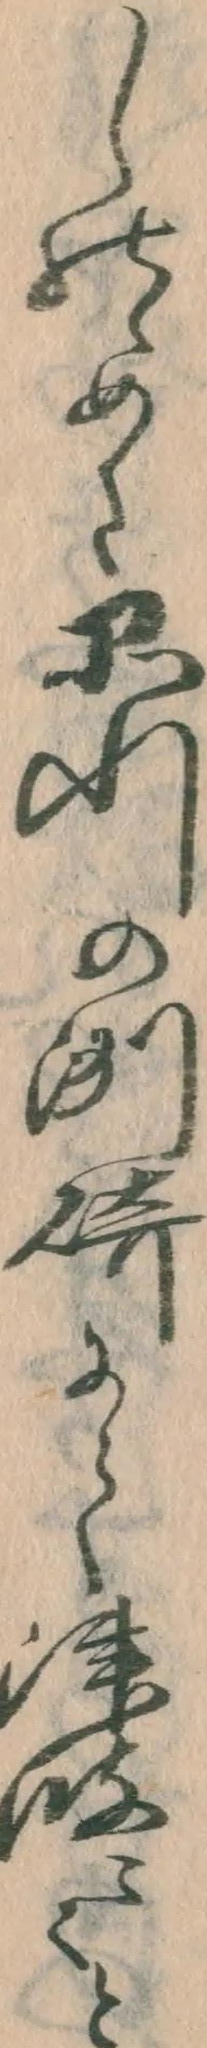しのゝめに品川の州崎にて津波々々と
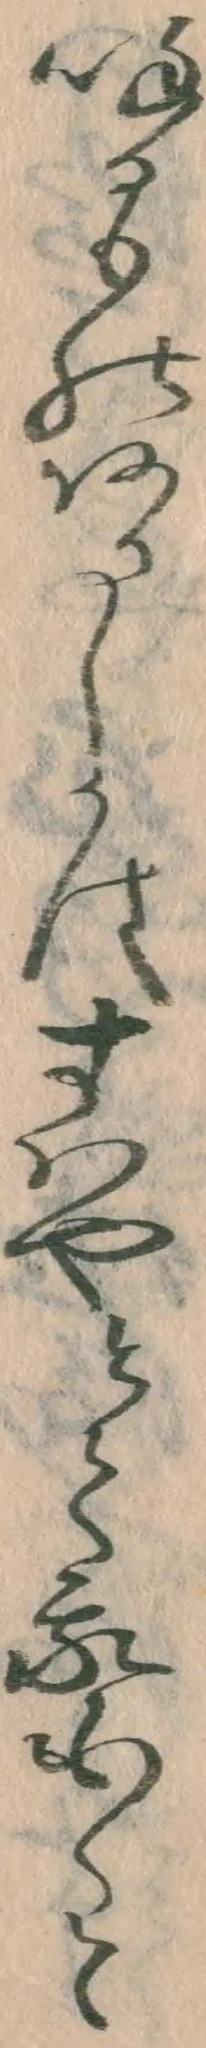呼るものありしかはすはハやとて我も〳〵と
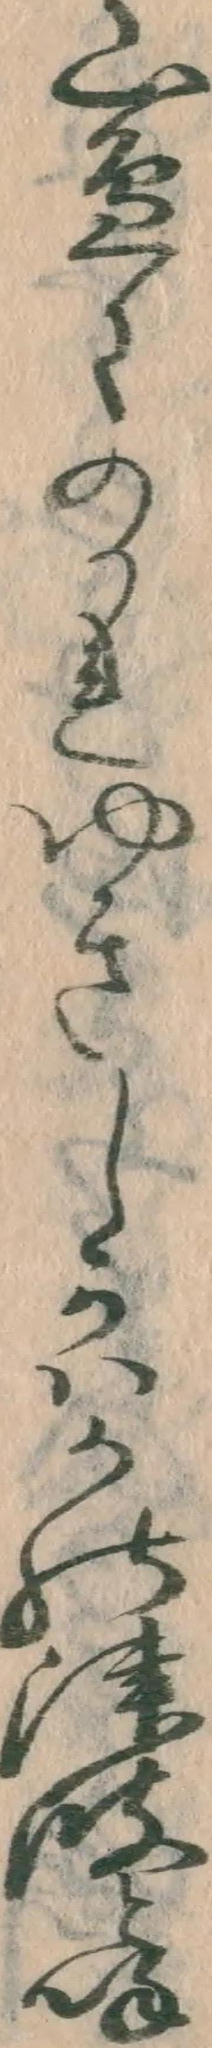山邊にのかれゆきしかハかの津波と呼
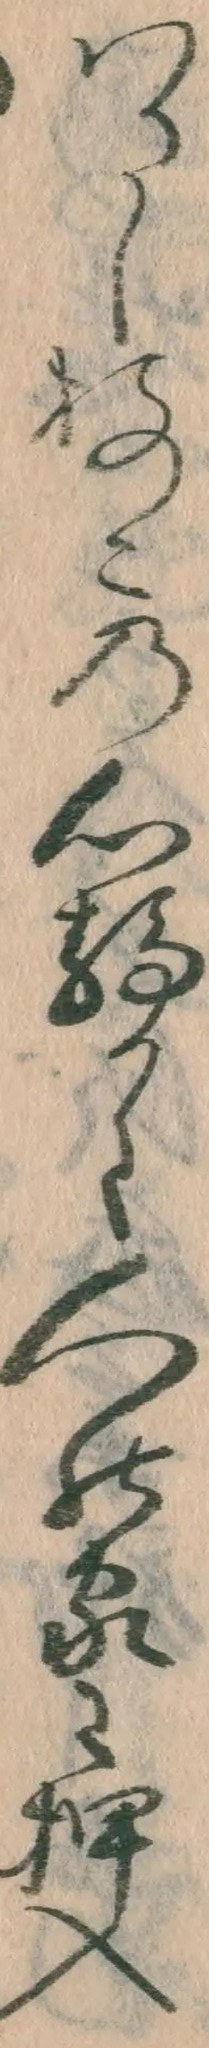わりしおのこの心静かに人の家に押入
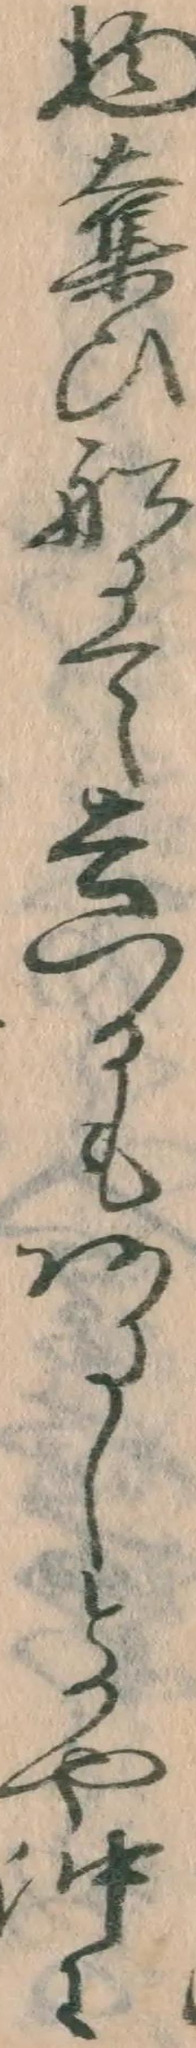物奪ひ船にて去つるもありしとかや沖に
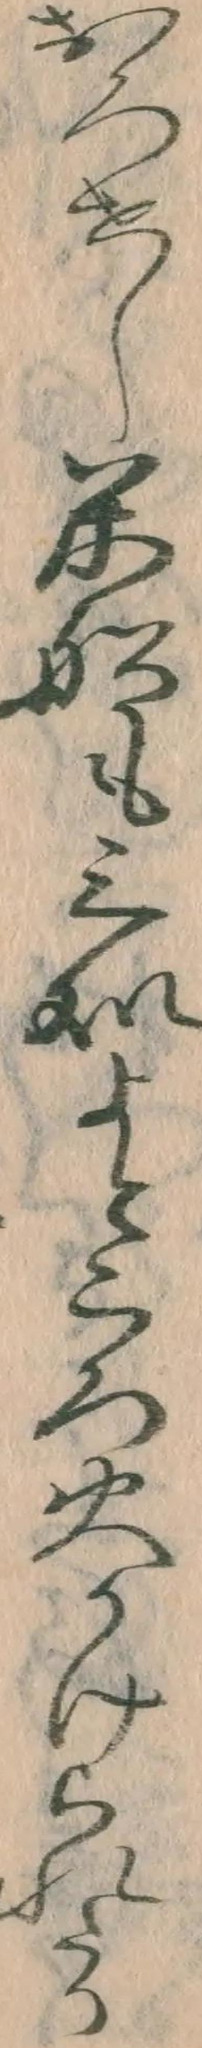おろせし米船も三処よところ火かけられたり
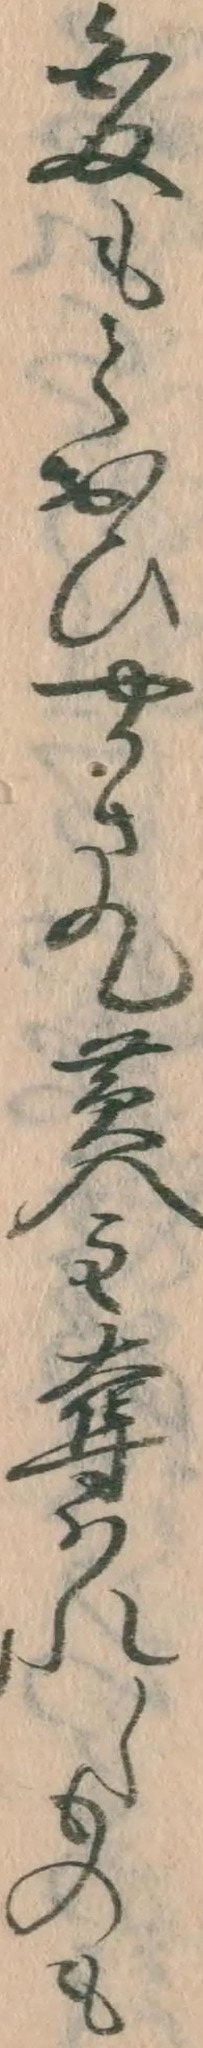白刃もておひやかされ黄金奪ハれしものも
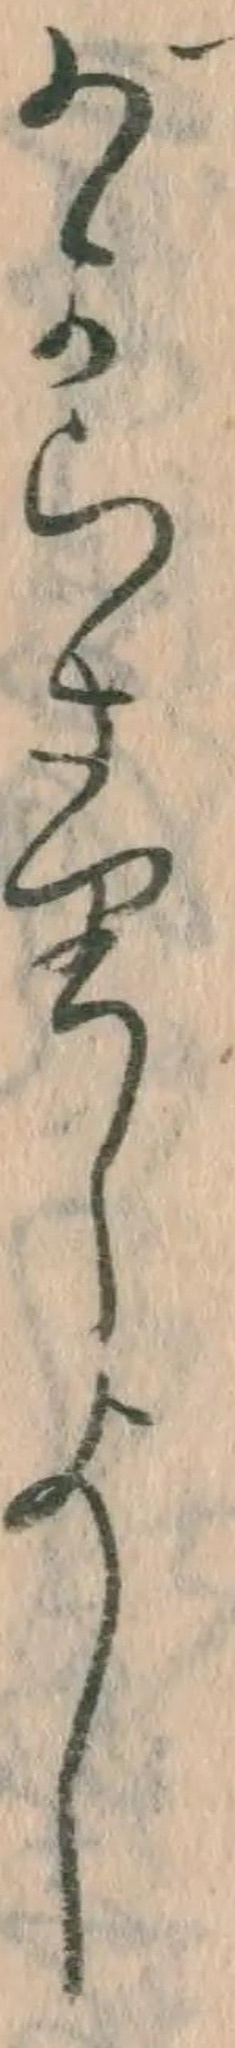少からさりしよし
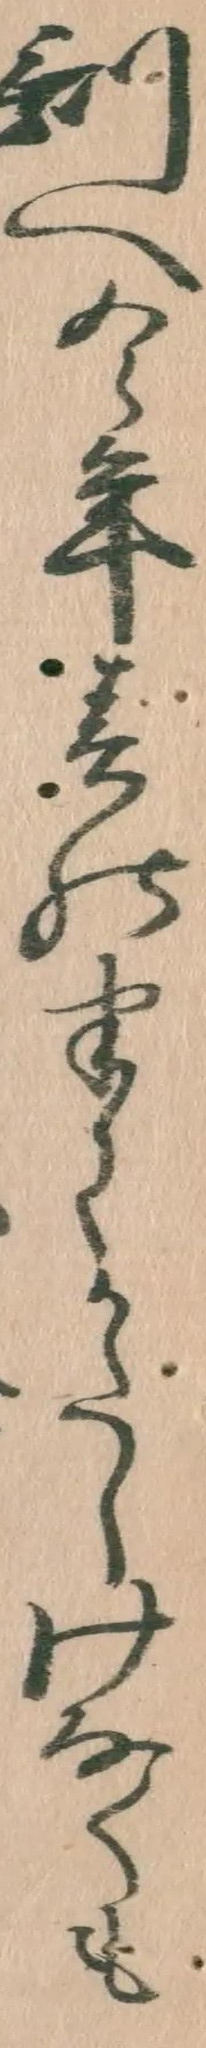剰へ今年春の半にかたしけなくも
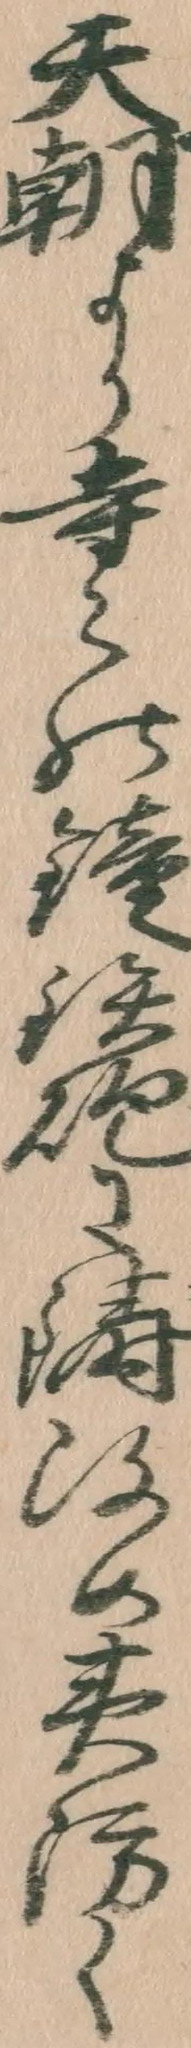天朝より寺々の鐘鉄砲に鑄改め夷防く
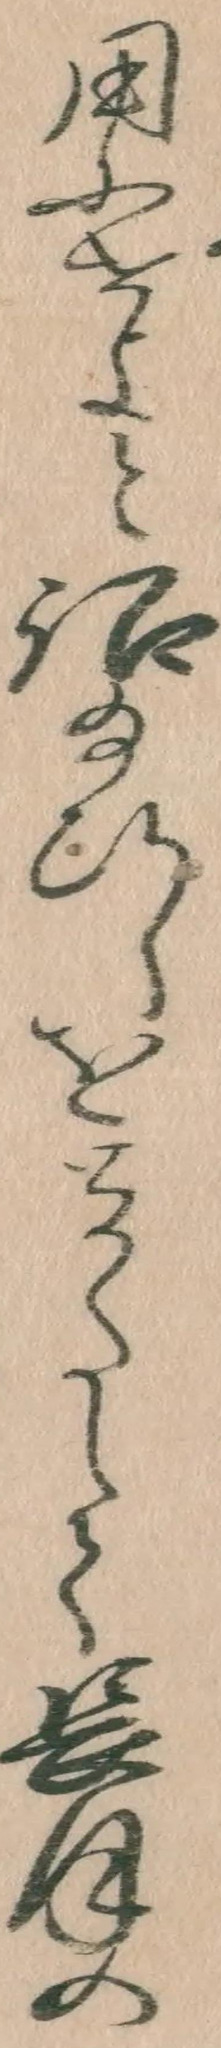用にせよと詔玉ひしをとかたして長月の
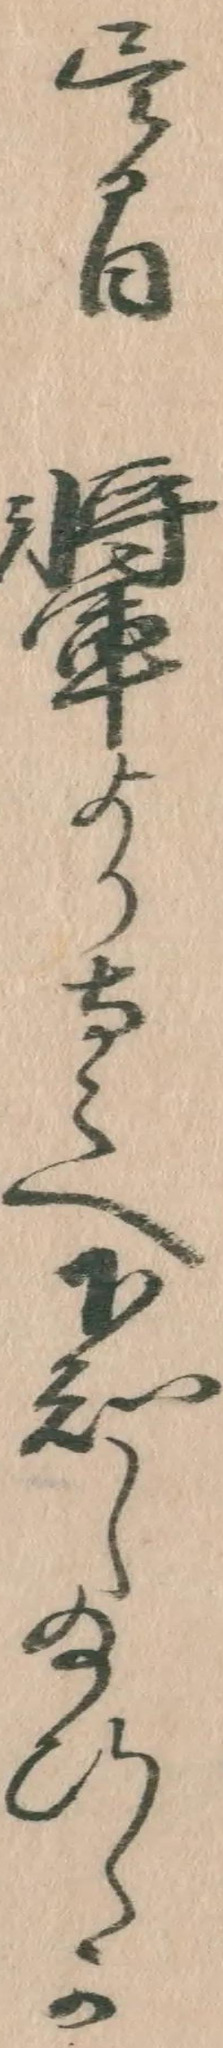盡る日将軍より寺々へ下知し玉ひしか
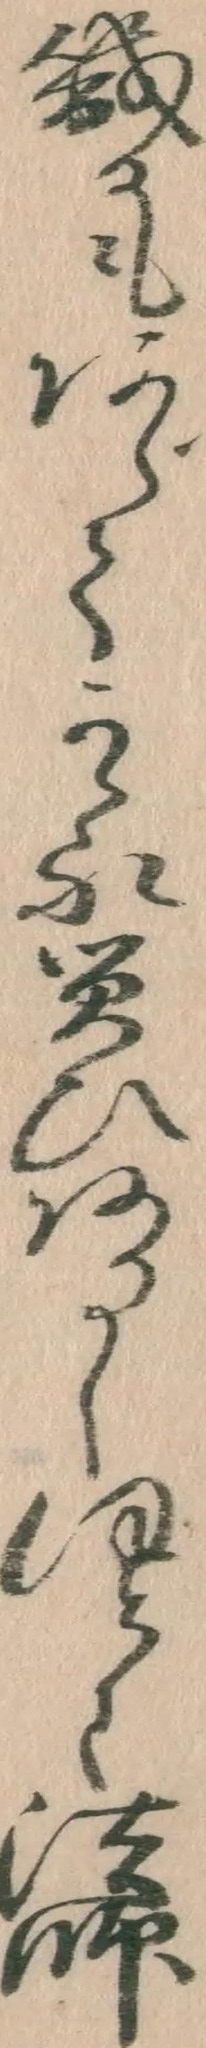幾日もあらてかゝる災ひありしほとに法師
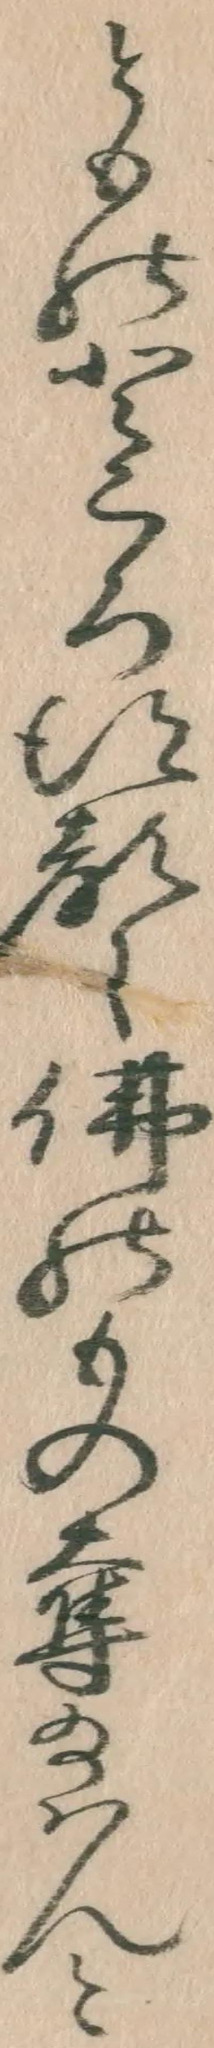とものところ得顔に佛のもの奪玉ハんと
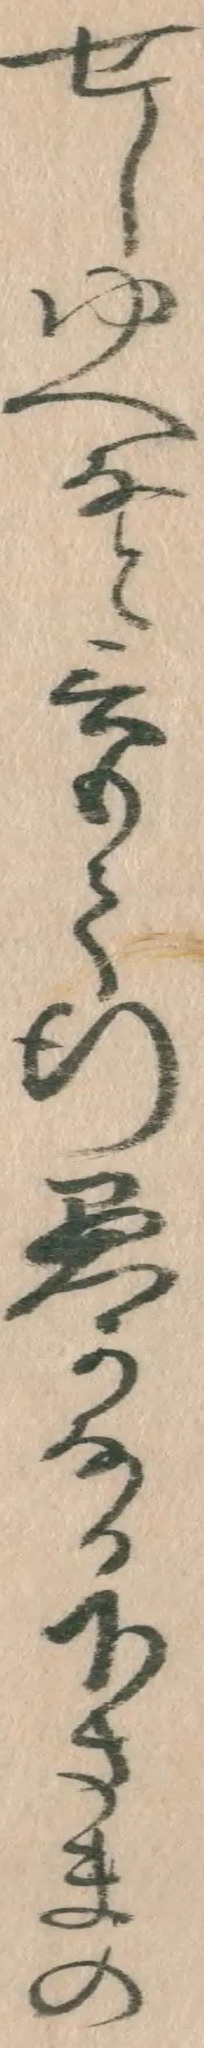せしゆへなと云もて行愚かなる下さまの
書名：麗斎叢書. 20
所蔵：国立国会図書館 National Diet Library, JAPAN
